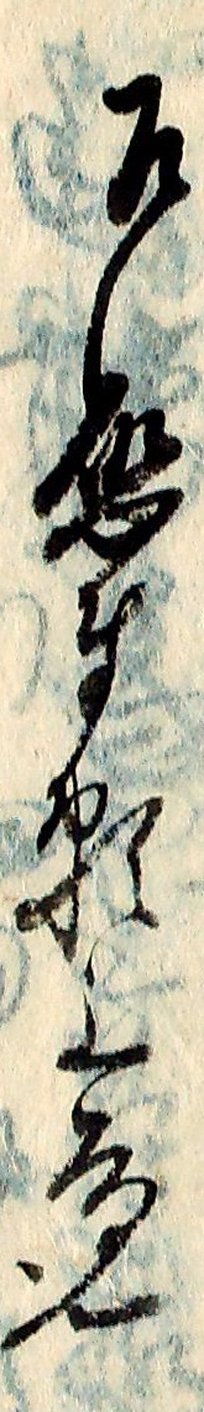乍恐奉願上覚
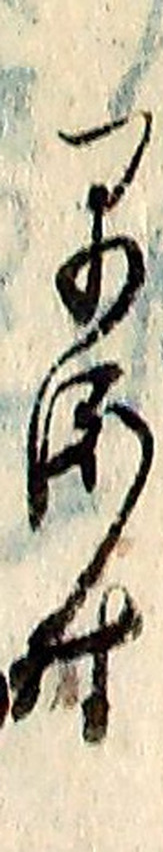早淵村
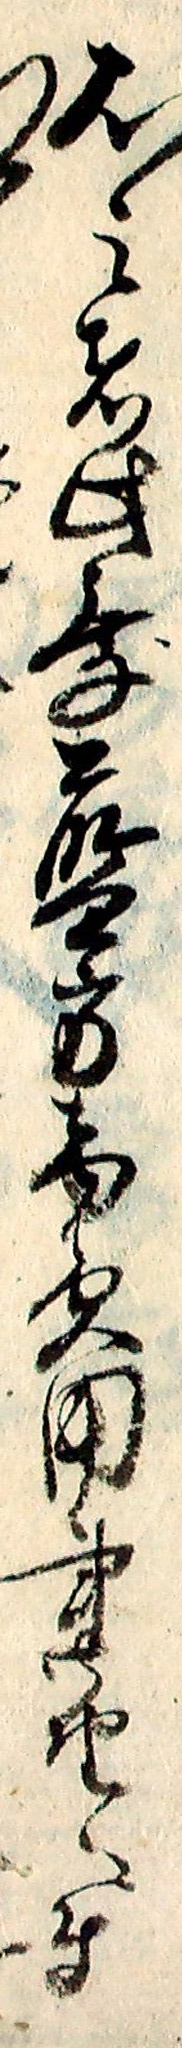右之者此度藍方商売用事御座候に付
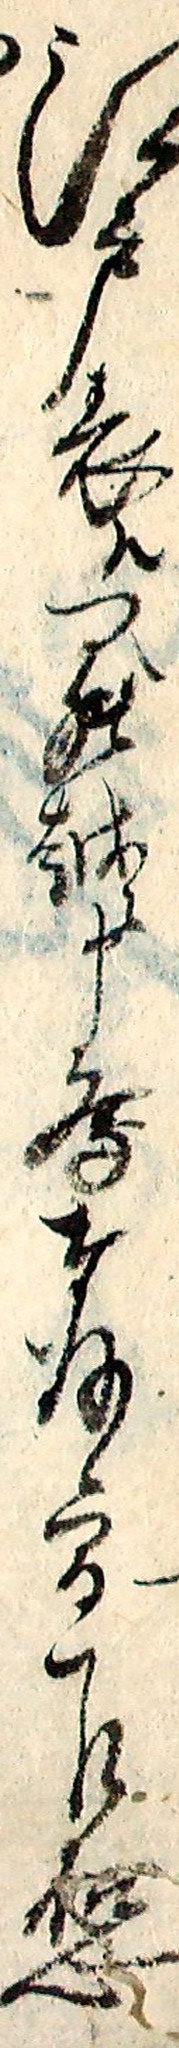江戸表え罷越申度奉存候間乍恐
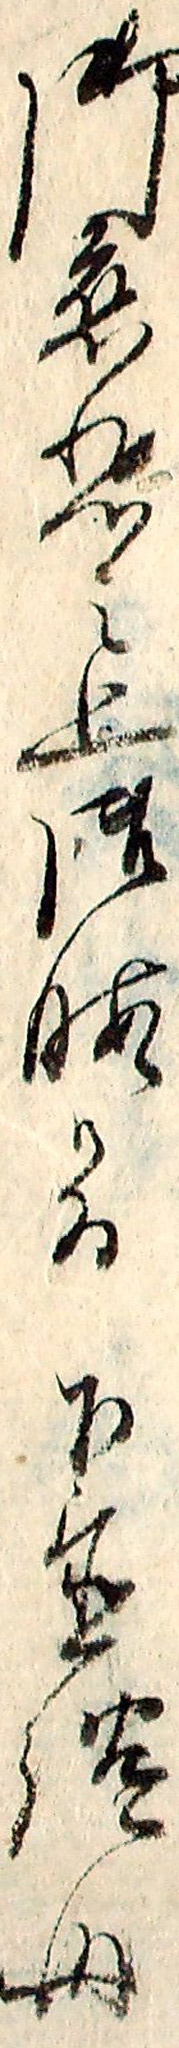御慈悲之上御暇被為下置淡州

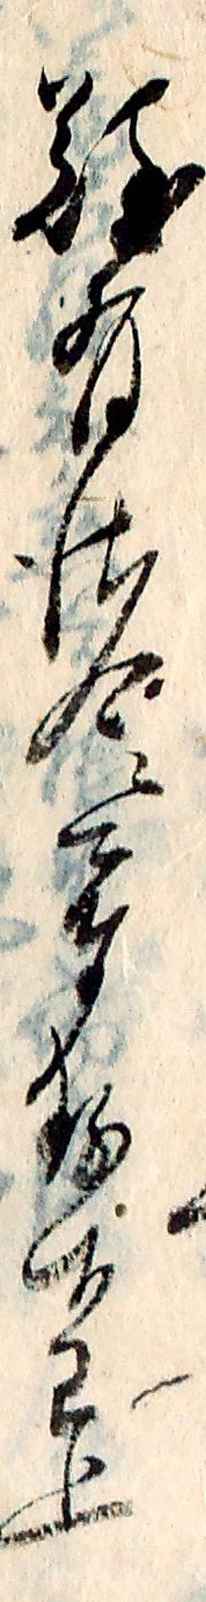難有仕合に可奉存候已上
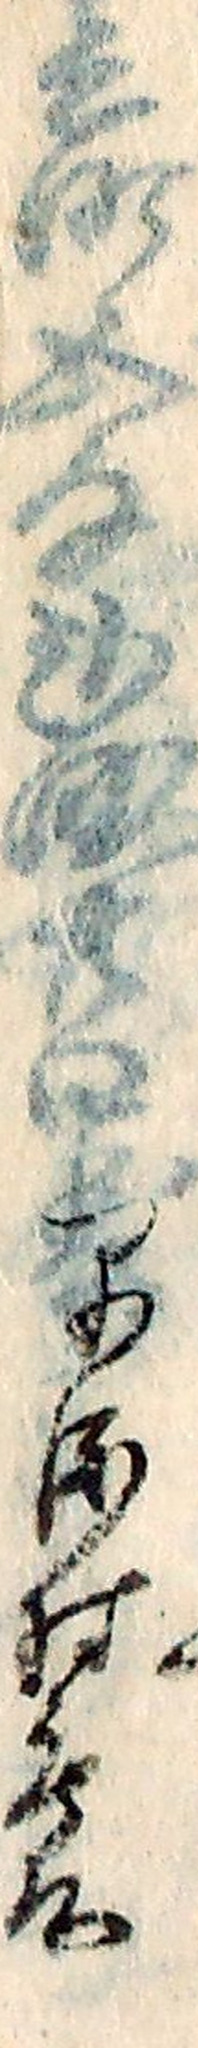早淵村庄屋
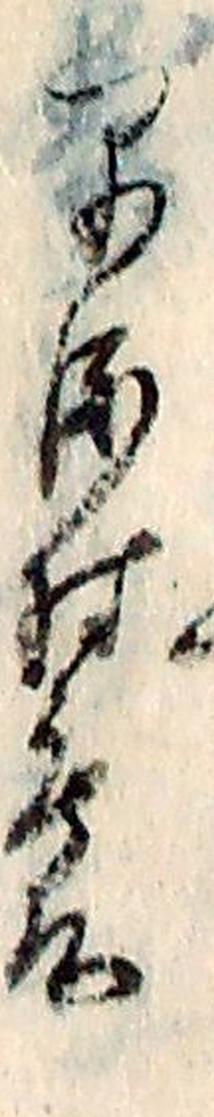早淵村庄屋
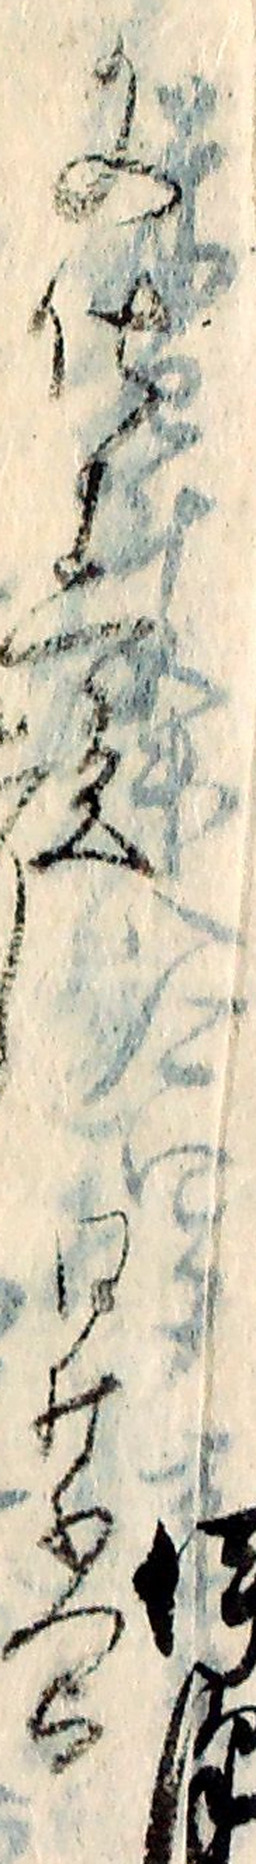文化十二亥同村五人与
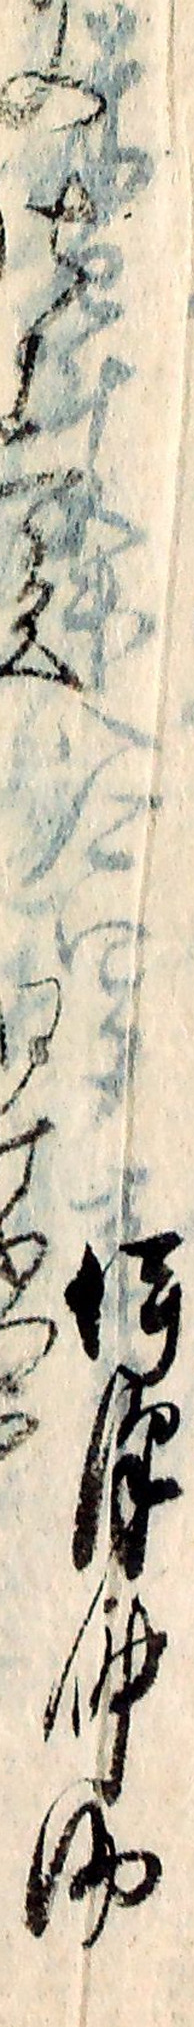伊沢仲助
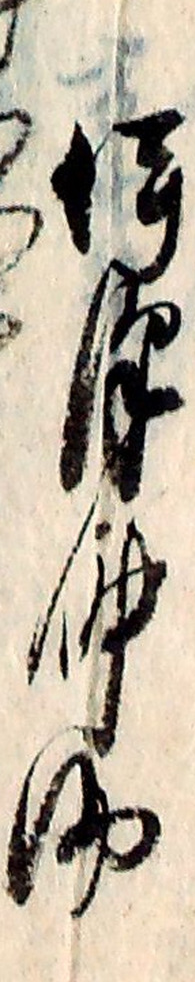伊沢仲助
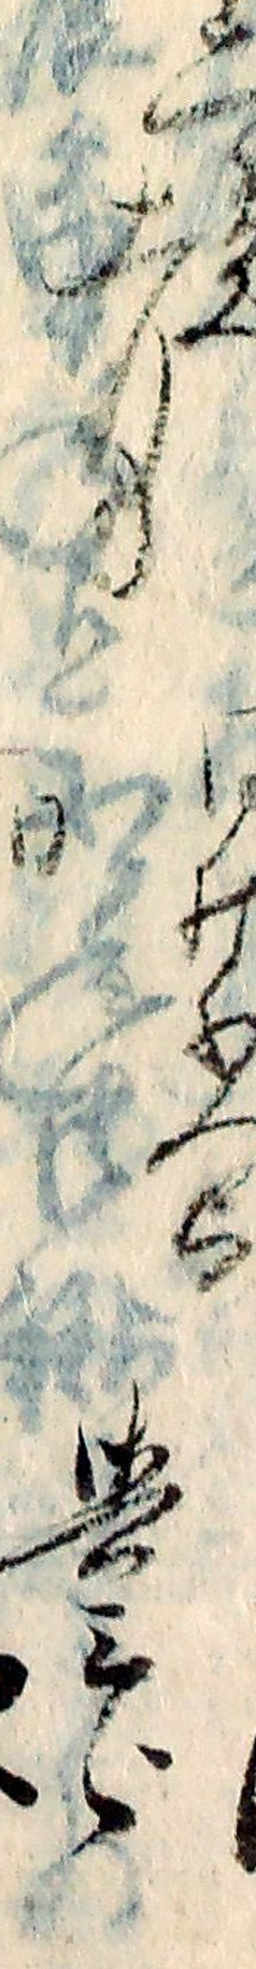十一月与三郎
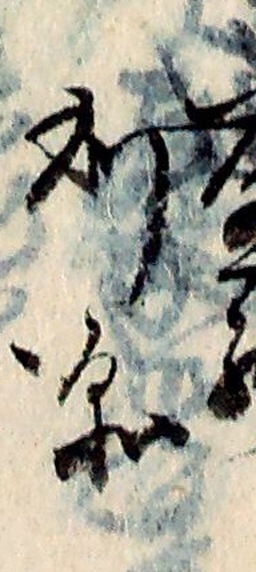利兵衛
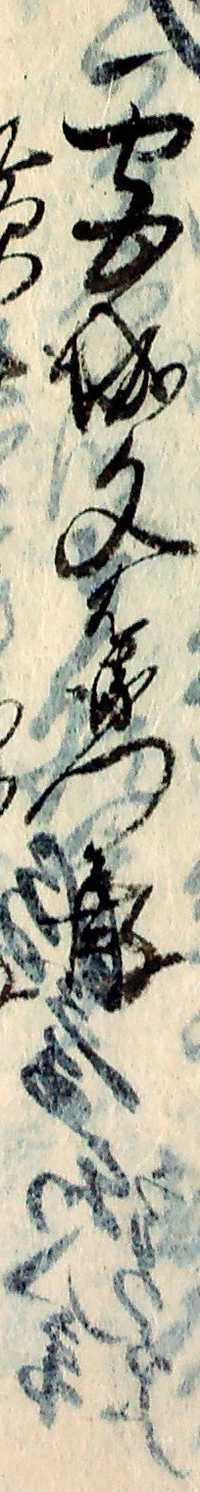宮城文右衛門殿
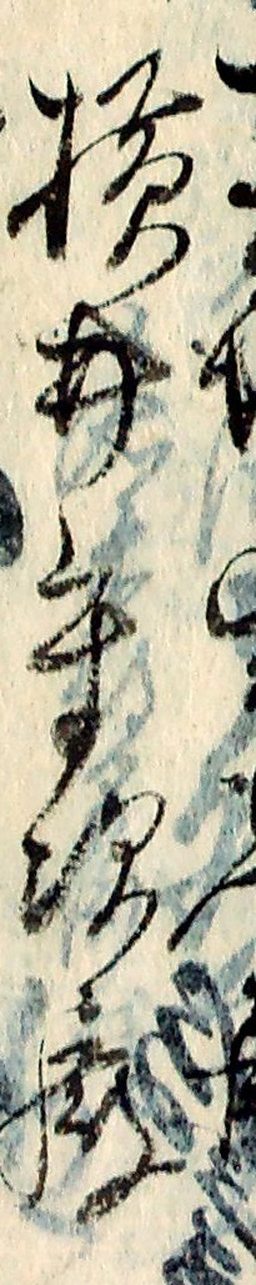横井守次殿
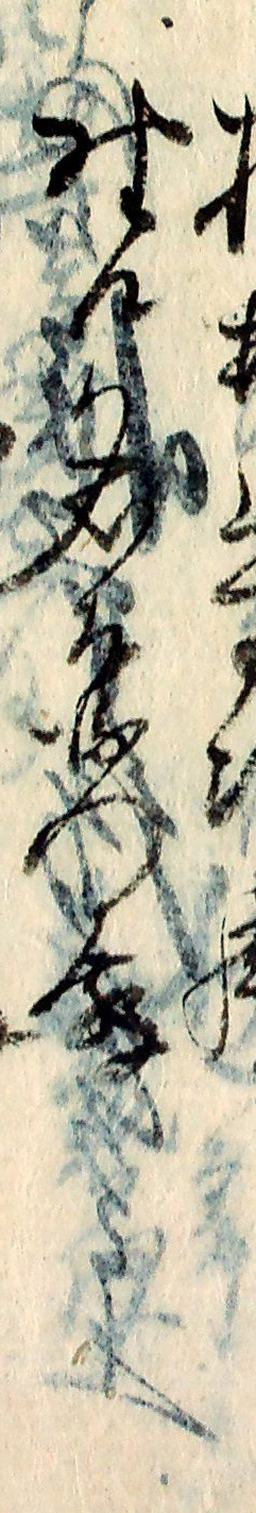野口名左衛門殿
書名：諸御願書控(後藤氏壱番）
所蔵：鳴門教育大学 Naruto University of Education
